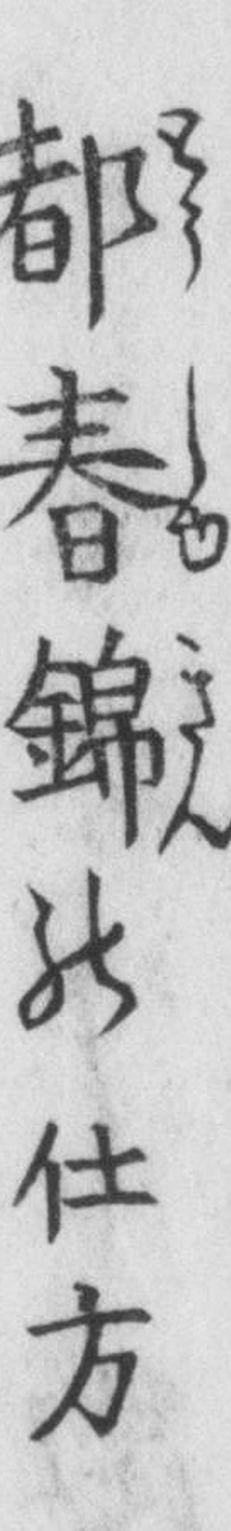都春錦の仕方
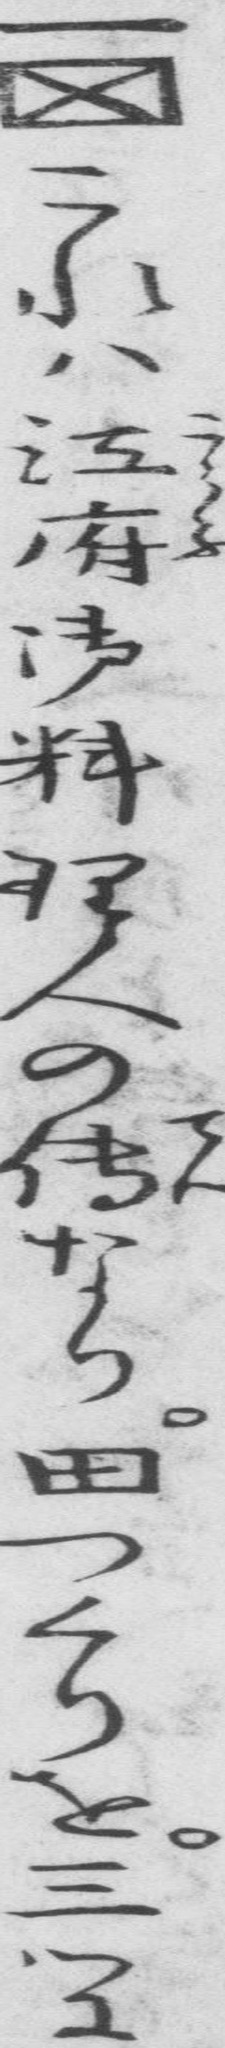一これは江府御料理人の伝なり。田つくりを。三ツに
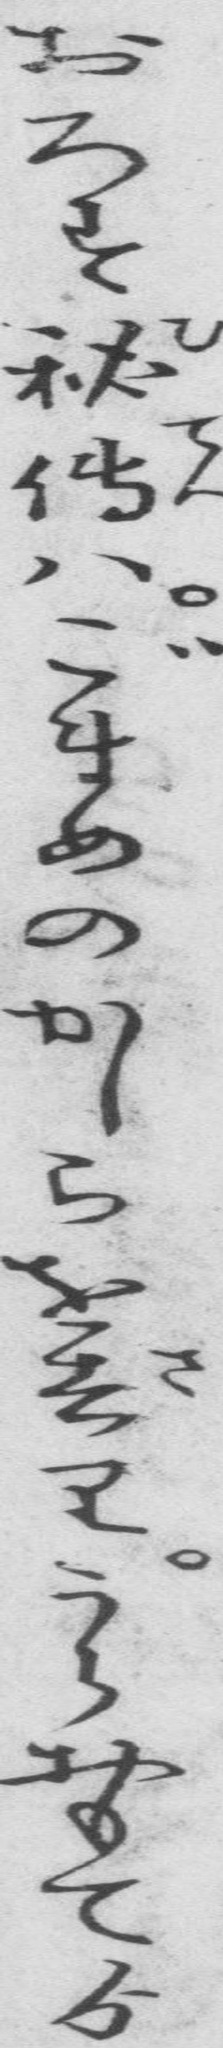おろす秘伝は。ごまめのかしらを去り。うらおもてゟ

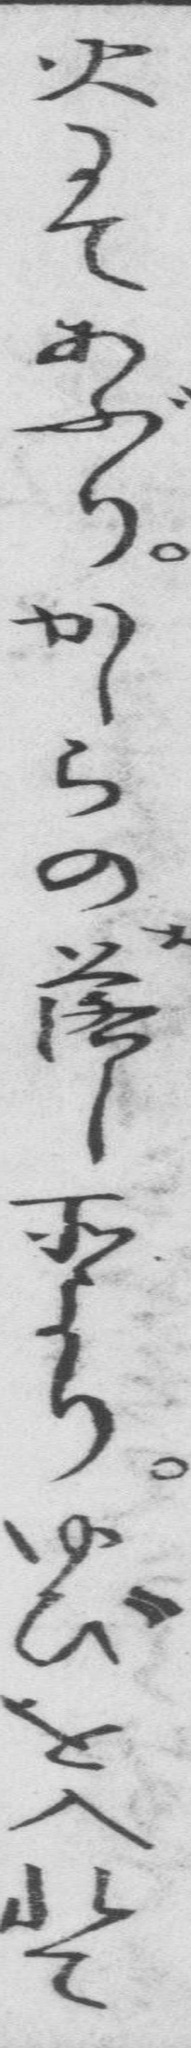火にてあぶり。かしらの落し所より。ゆびを入れて
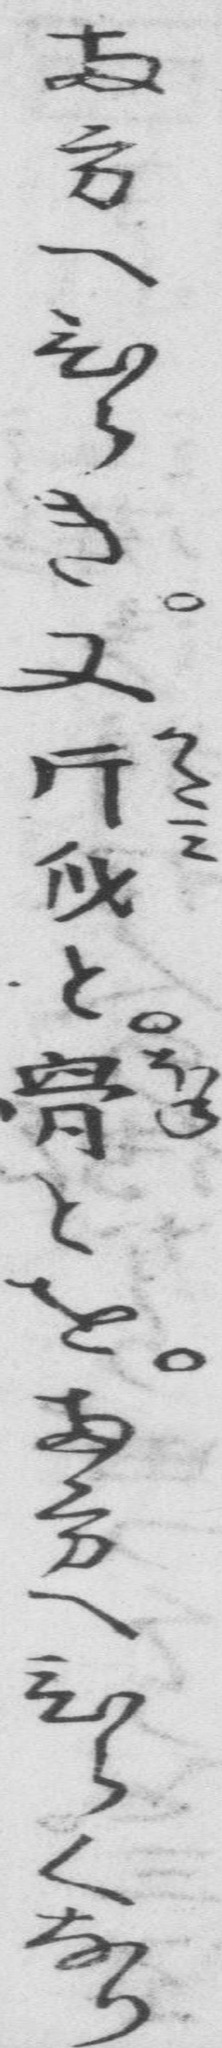両方へひらき。又片身と。骨とを。両方へひらくなり
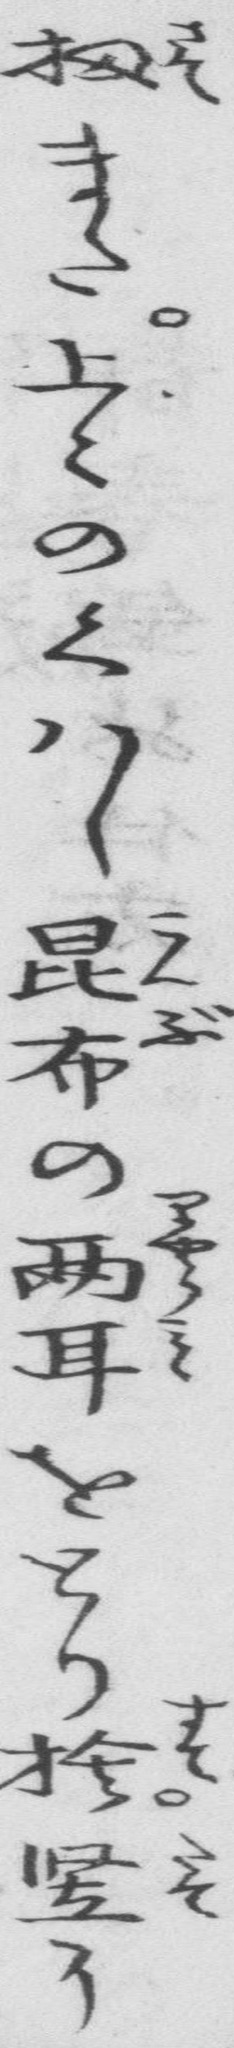扨また。上々のくはし昆布の両耳をとり捨。竪に
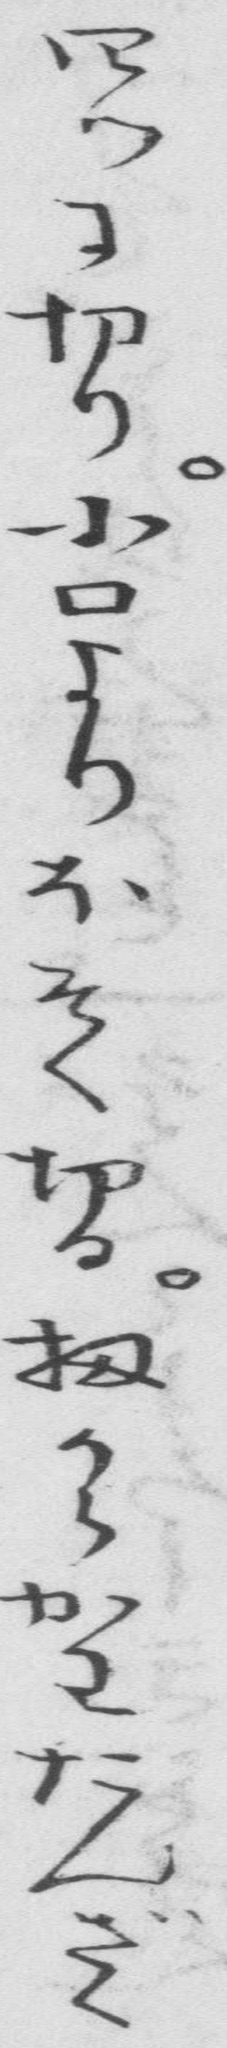四ツに切り。小口よりほそく切る。扨からかわたんざく
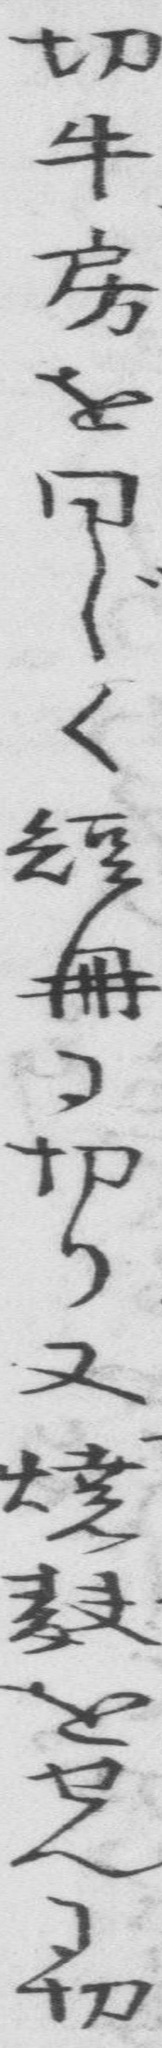切。牛房を同じく短冊に切り。又焼麩を。せんに切
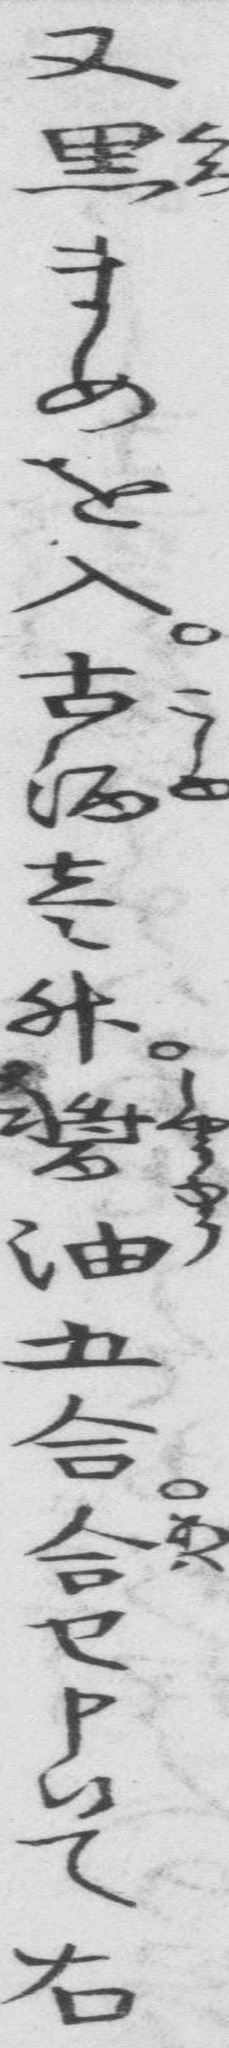又黒まめを入。古酒壱升。醤油五合。合せ申候て右
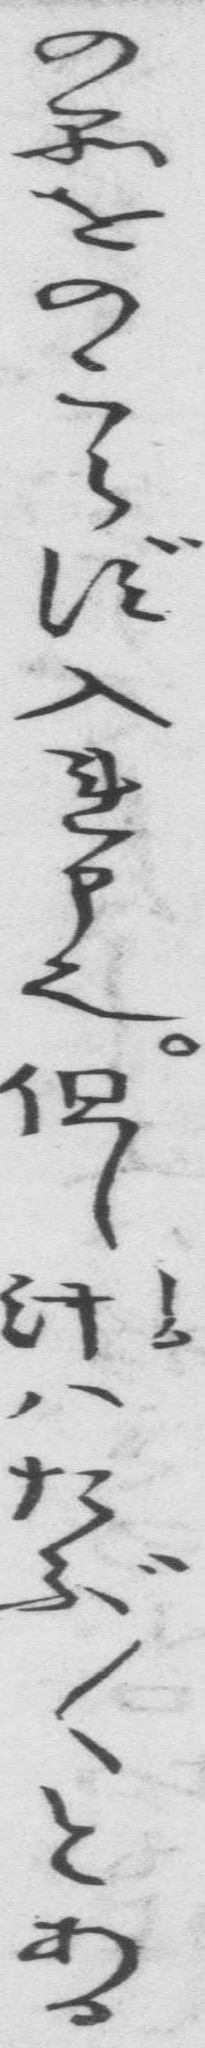の品をのこらず入れ申也。但し汁はたぶ〳〵とある
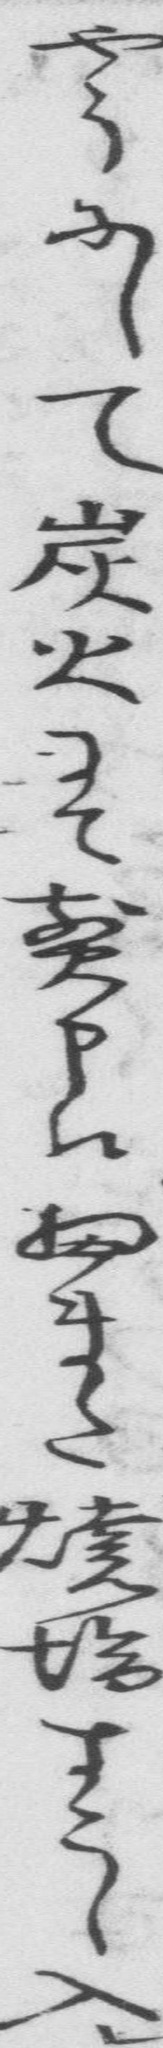やうにして。炭火にて煎申候。扨また焼塩すこし入れ
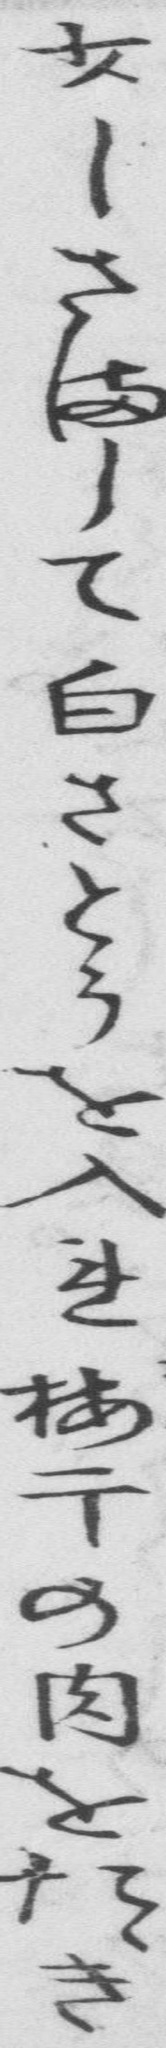少しさまして。白さとうを入れ。梅干の肉をたゝき
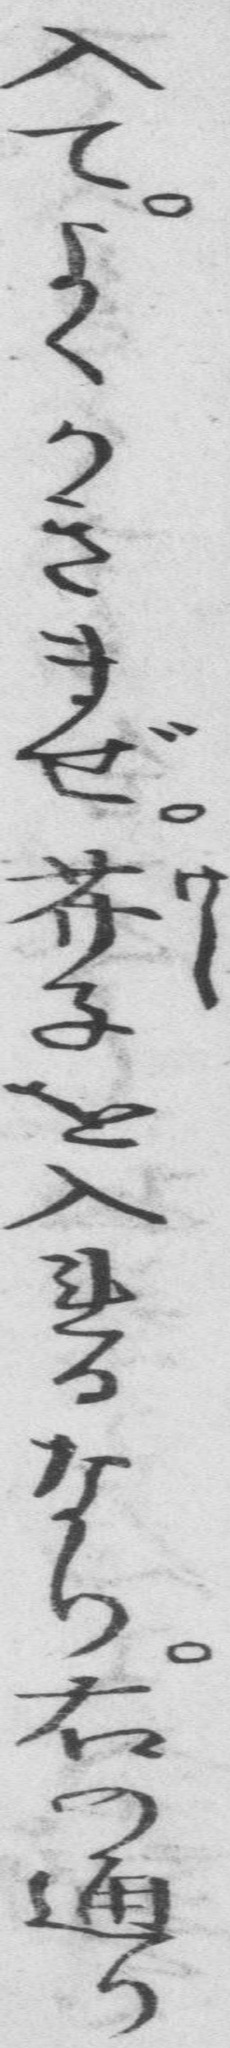入て。よくかきまぜ。芥子を入れるなり。右の通り
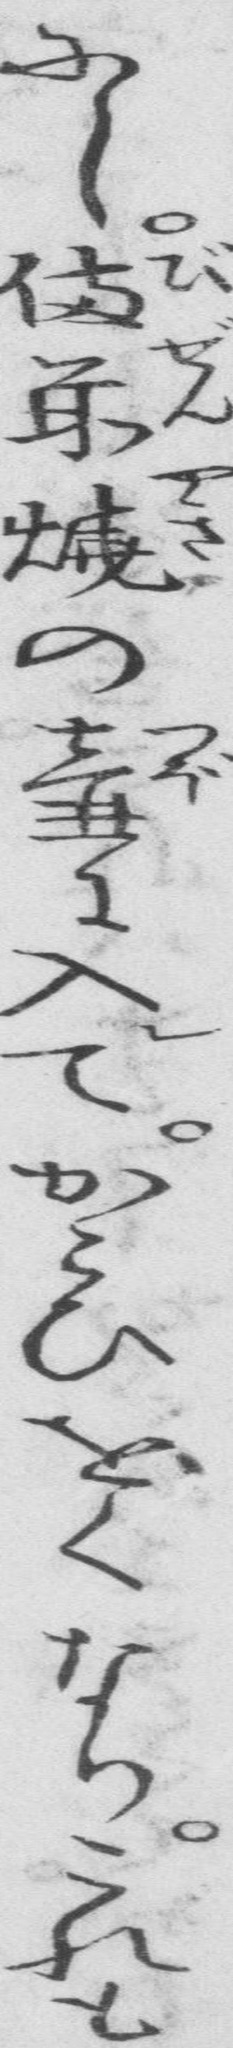にし。備前焼の壺に入れて。かこひをくなり。これも
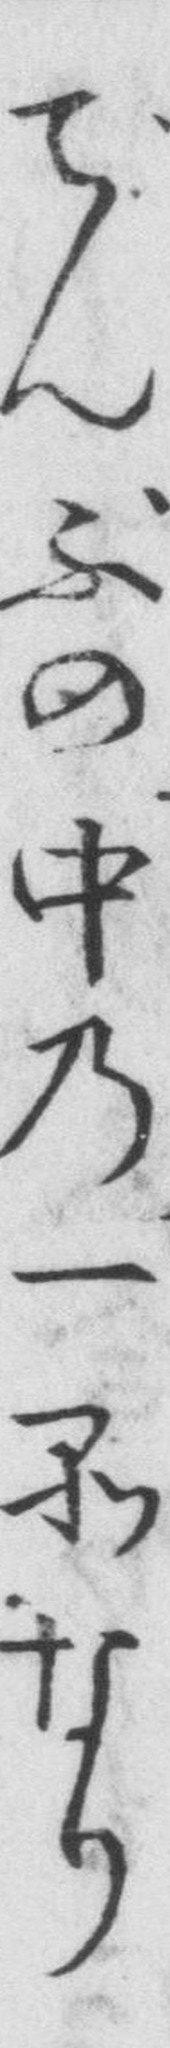でんぶの中の一品なり
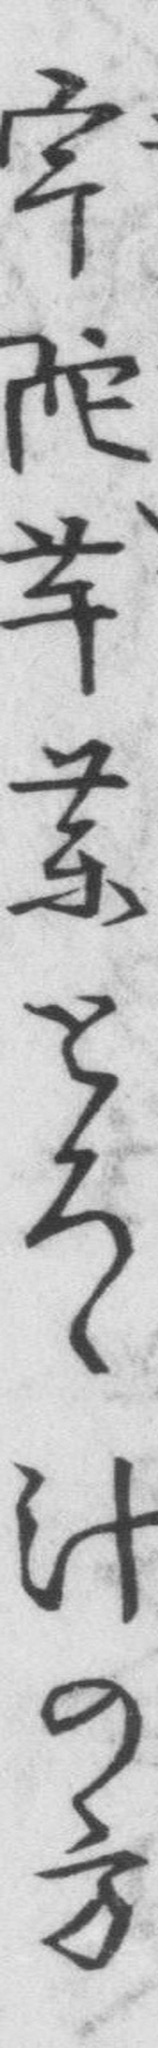宇陀芋薬とろゝ汁の方
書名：萬寳料理秘密箱
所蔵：大阪府立大学学術情報センター 国文学研究資料館
